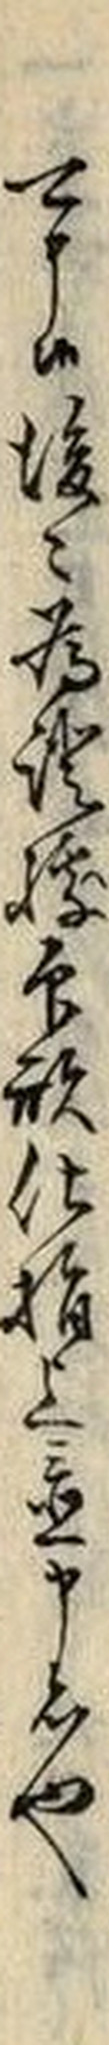可申候後々為証拠印形仕指上置申者也
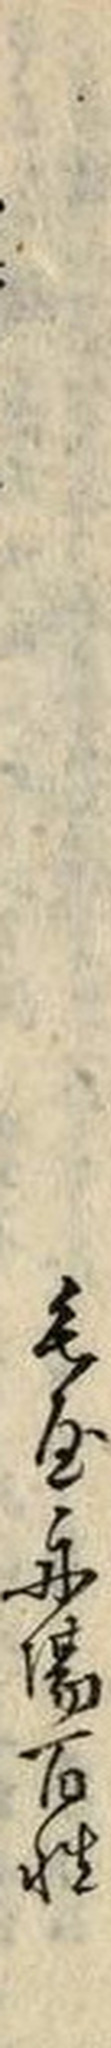毛屋舟場百姓
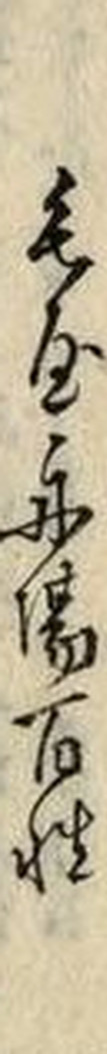毛屋舟場百姓
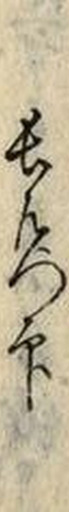平左衛門印
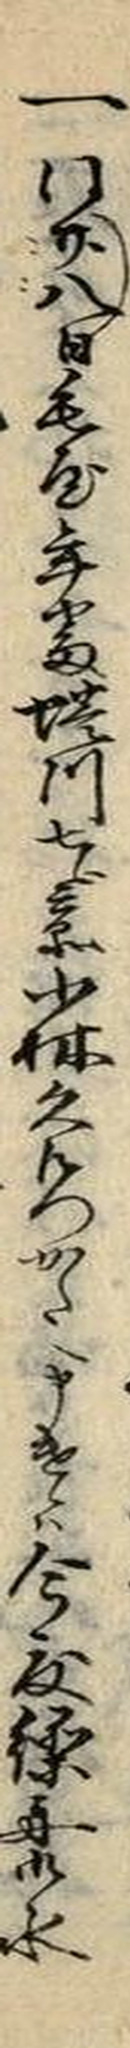一同廿八日毛屋年番蜷川七郎兵衛小林久左衛門かたへ申遣候は今度繰舟御水
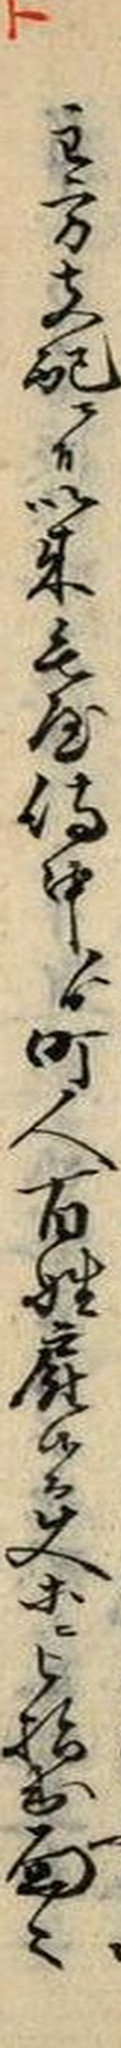主方支配に付以来毛屋侍中ゟ町人百姓雇候て使等に被指出面々

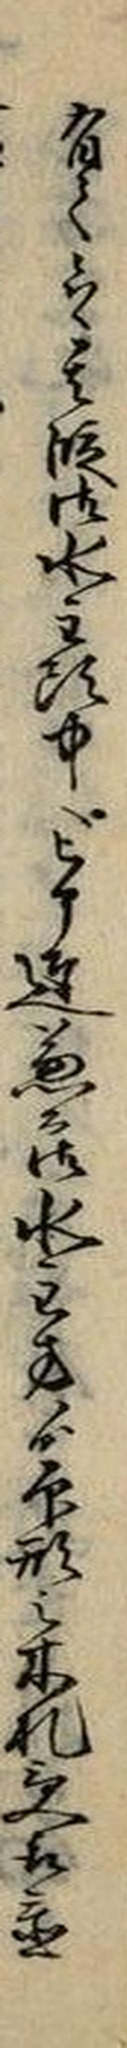有之候はゝ其段御水主頭中へ被申達兼て御水主方ゟ印形之木札受取置
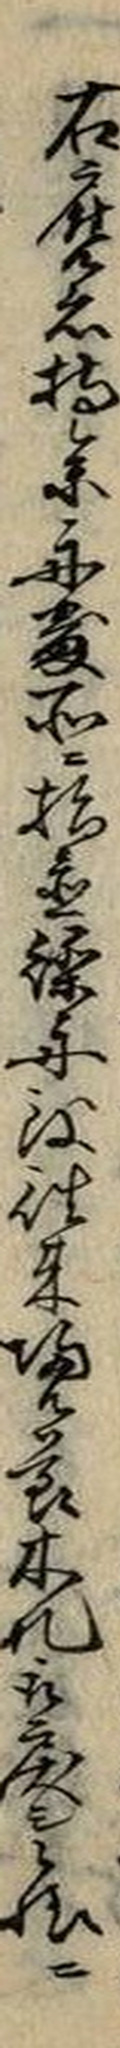右雇候者持参舟番所に指置繰舟致往来帰候節木札取戻シ候様に
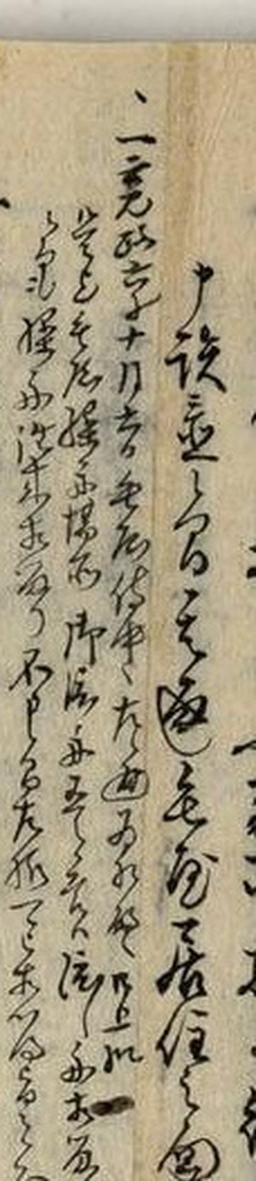一寛政六刁十月六日毛屋侍中へ左之通為相触候口上控
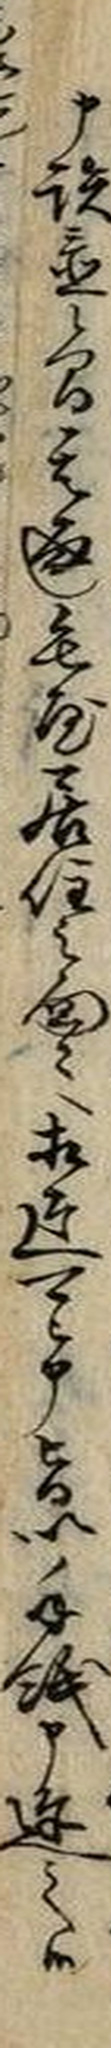申談置候間其通毛屋居住之面々へ相達可被申旨以手紙申達之候
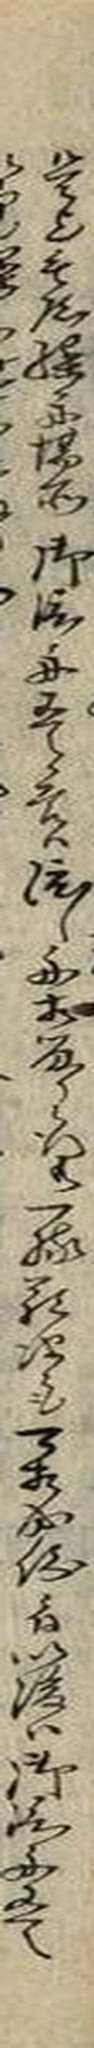是迄毛屋繰舟場所御渡舟有之候節は渡し舟相留り候得共一統難儀にも可相成儀に付以後は御渡舟有之
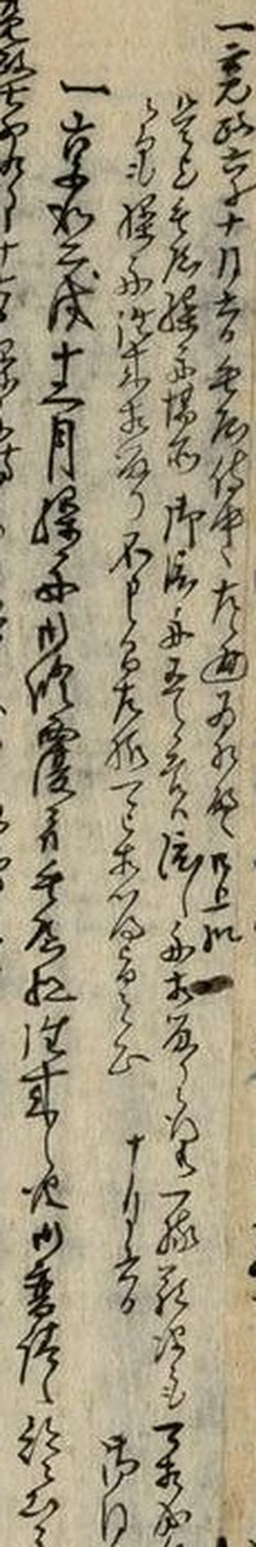候ても繰舟往来相留り不申候間左様可被相心得旨に候以上十月六日御目付
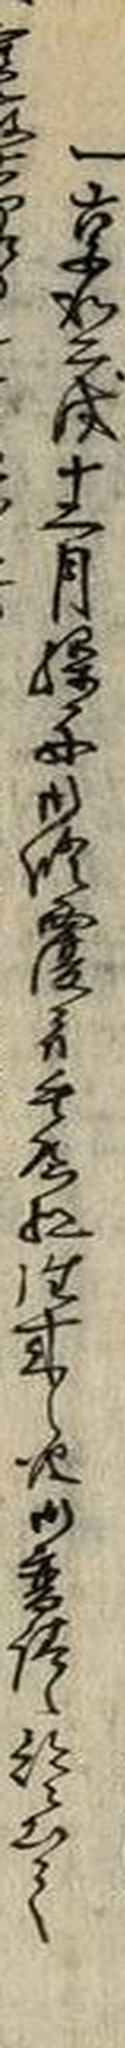一享和二戌十二月繰舟御修覆に付毛屋組往来之儀御普請之部に出之
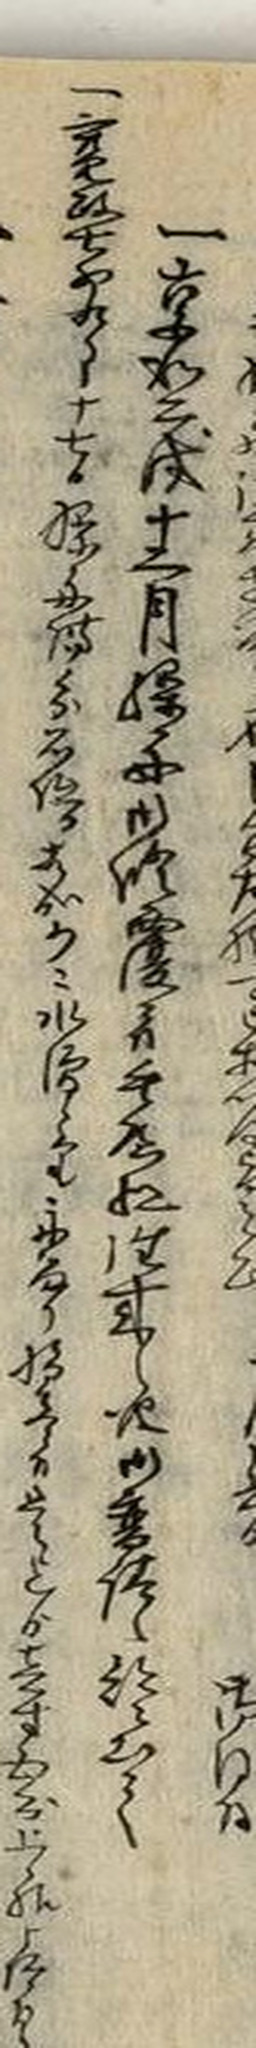一寛政七卯九月十七日繰舟場分石低ク相成少々水増にても舟留り指支に付是迄ゟ壱寸五分上候様被仰付候事
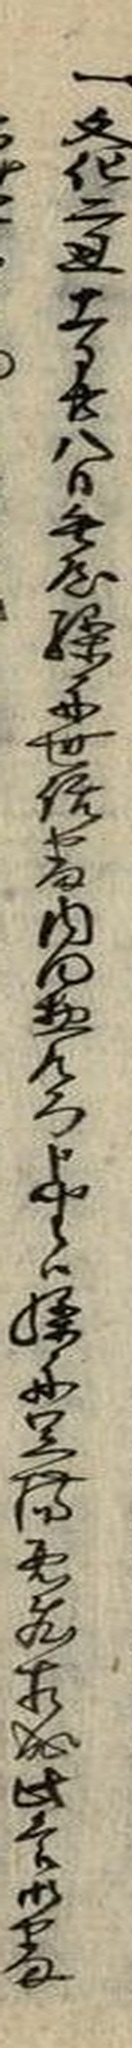一文化二丑十一月廿八日毛屋繰舟世話番内田惣左衛門申聞候は繰舟足場悪敷相成此節御番
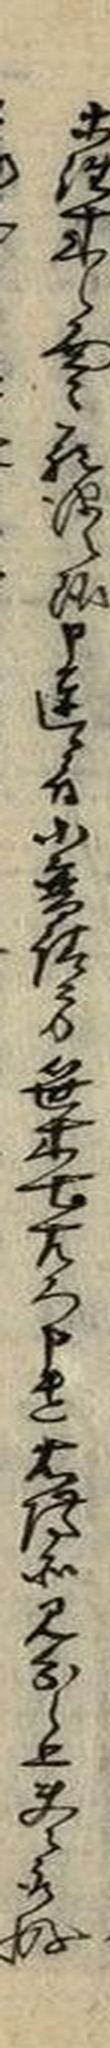等往来之面々難儀之趣申達候に付小普請方笹木七左衛門申遣右場所見分之上夫々取扱
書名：御城下諸事之部
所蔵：福井県文書館 Fukui Prefectural Archives
